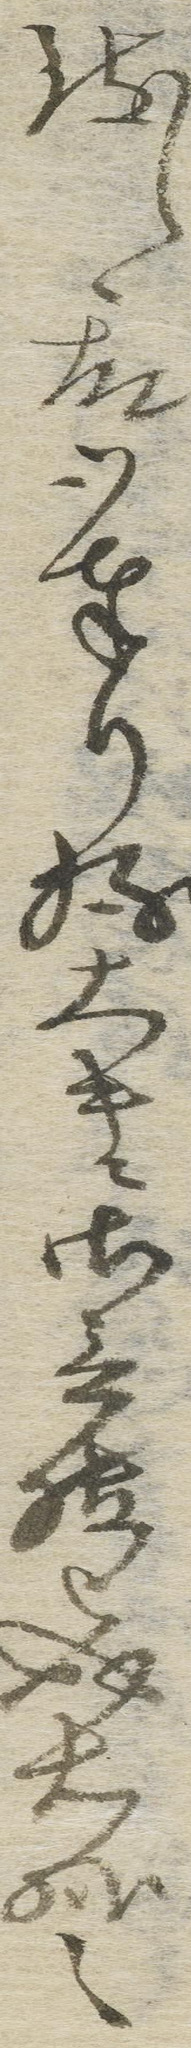致候故御奉行様大キ二御立腹被成右様之
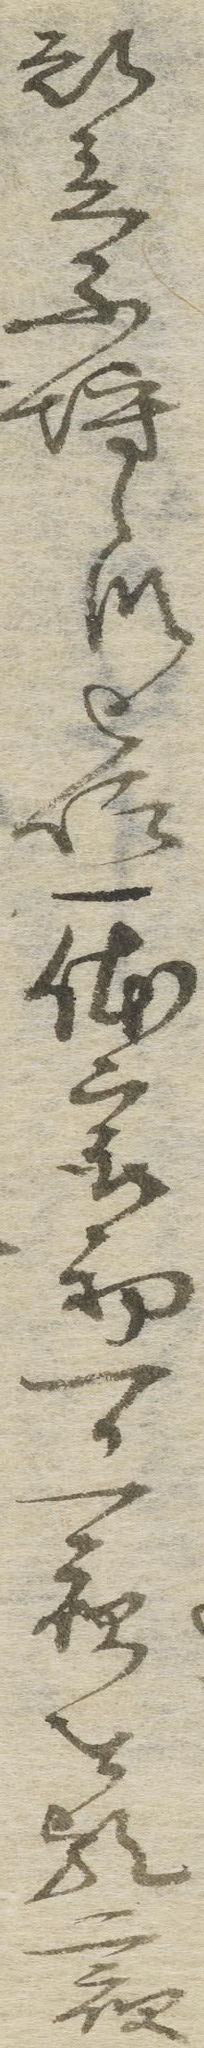願立不埒之段被仰一体最初一日一夜を願二夜
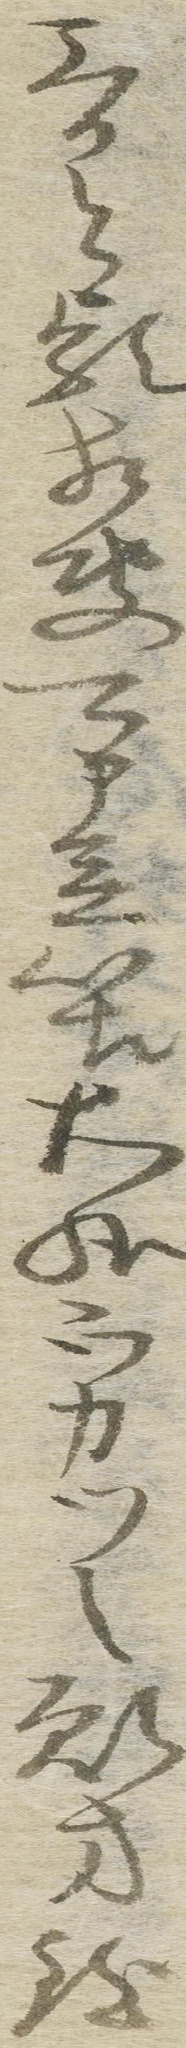三日之願相決可申立筈右様ウカツ之願方致
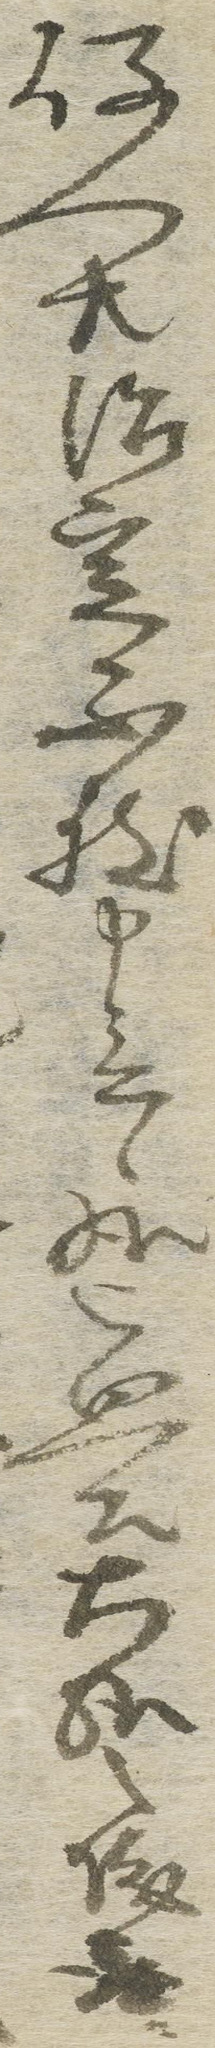役人共治実不致申立候様被思召右様之儀取
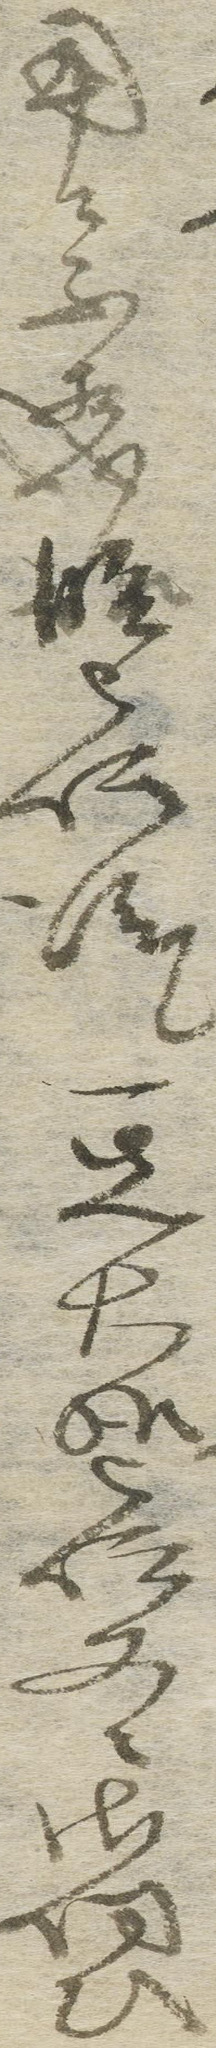用二不相成段被仰渡候一先右様被仰又々御伺ひ
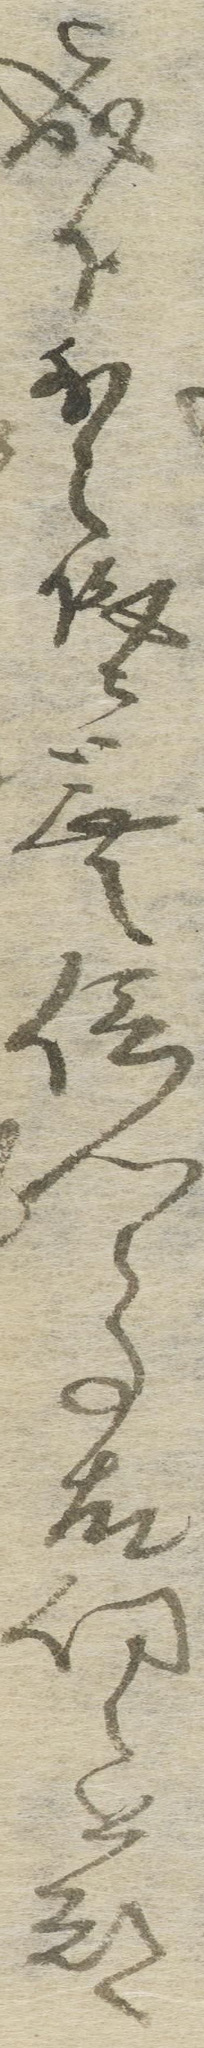被成候外之儀二ハ無之伝心事故伺之上願之
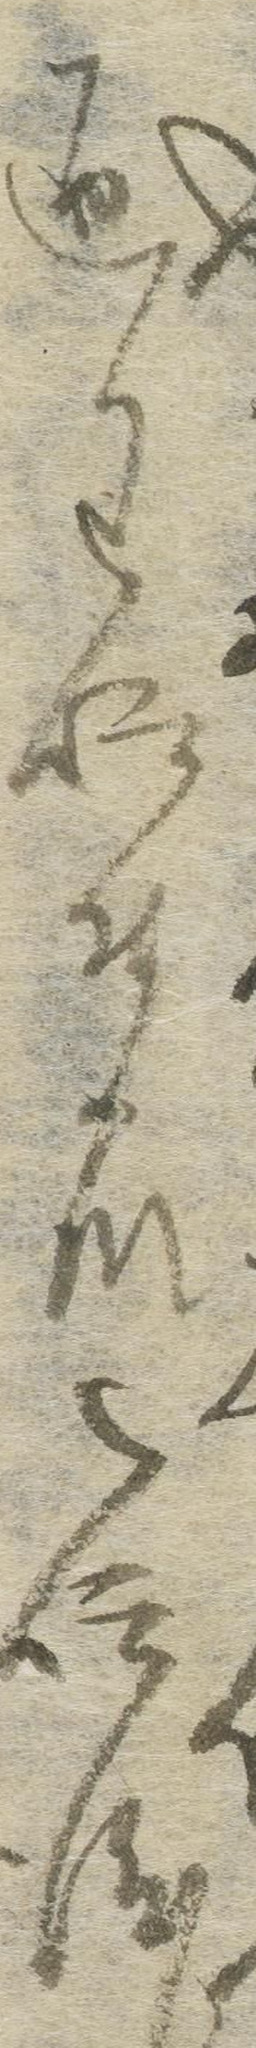通り被仰付候段被仰渡候

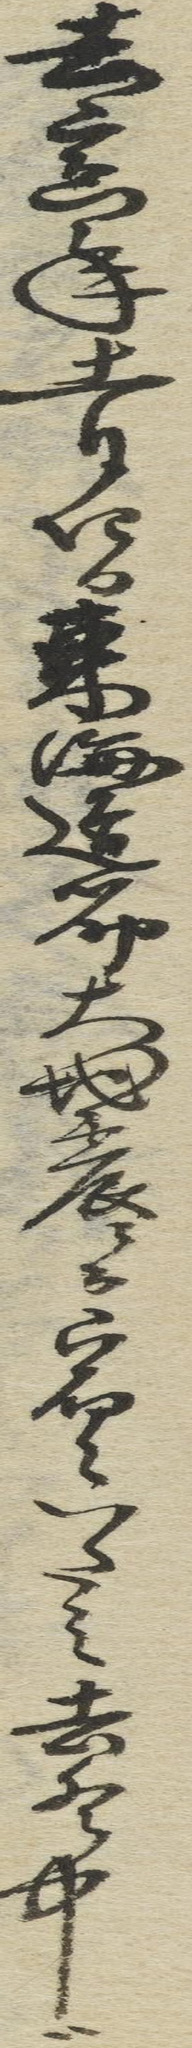去寅年十一月四日東海道筋大地震二而宿々いたミ去冬中ハ
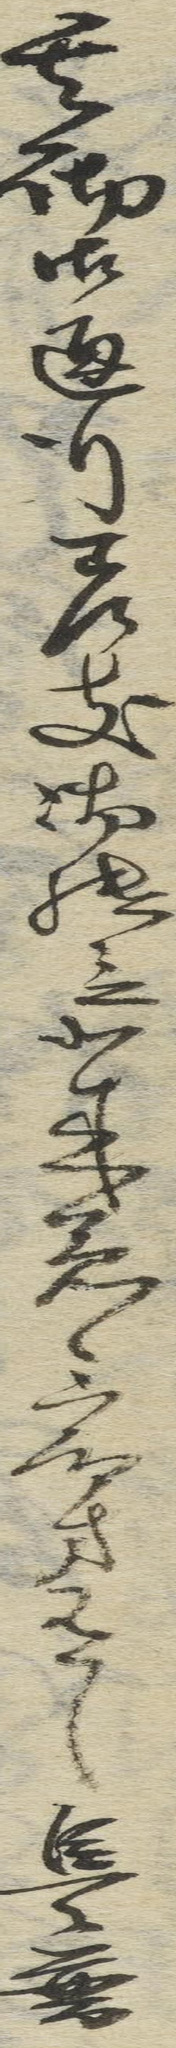其砌御通行差支御継立出来兼候宿方有之追々普
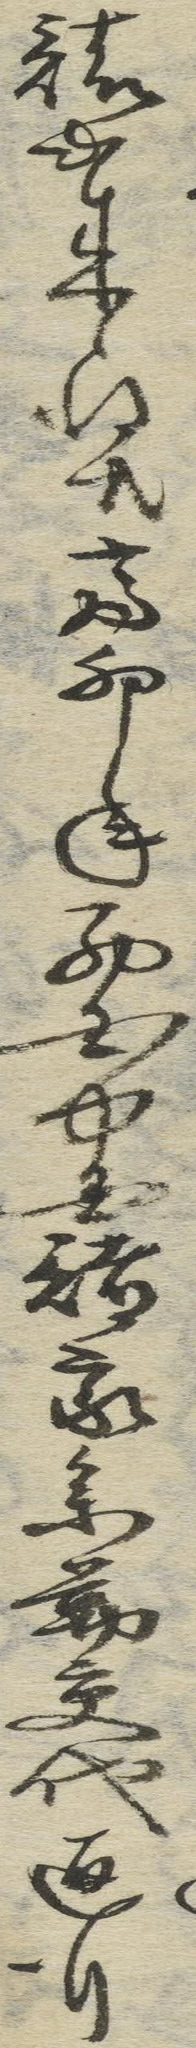請出来候得共当卯年西国中国諸家参勤交代通行
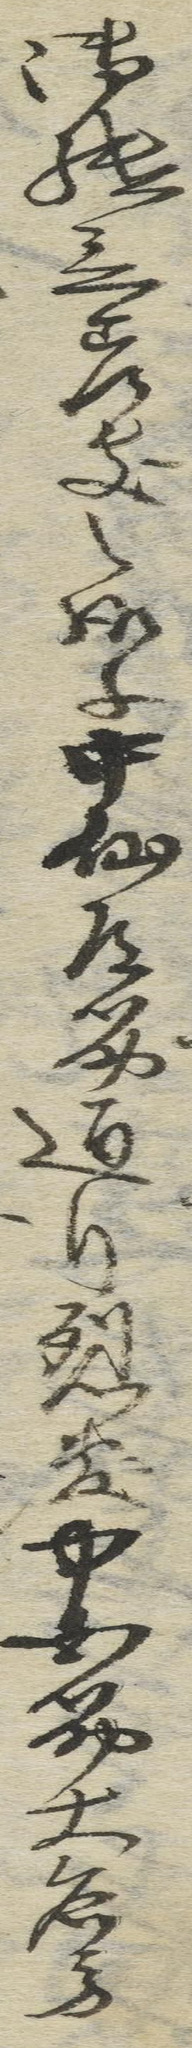御継立差支之様子中仙道筋通行烈敷中国筋大名方
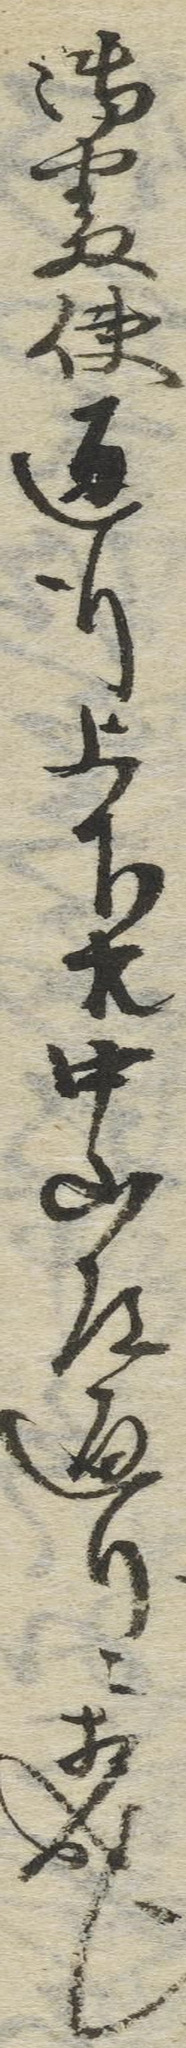御番使通行上下共中山道通行二相成申候
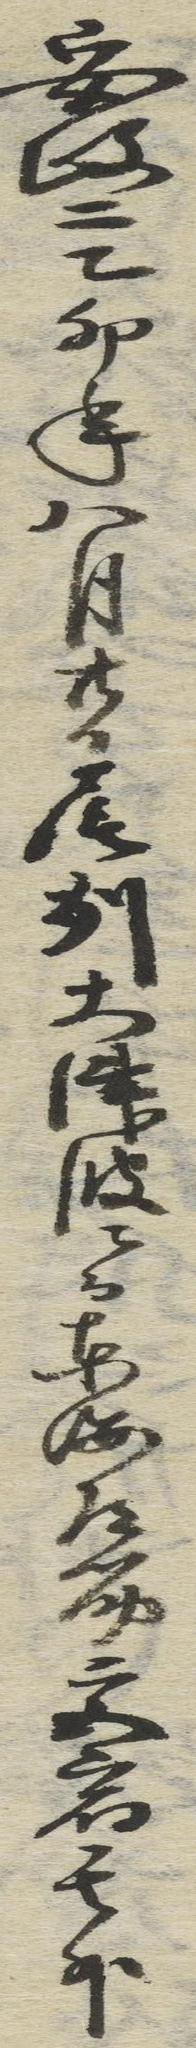安政二乙卯年八月廿日尾州大津波二而東海道筋宮宿其外
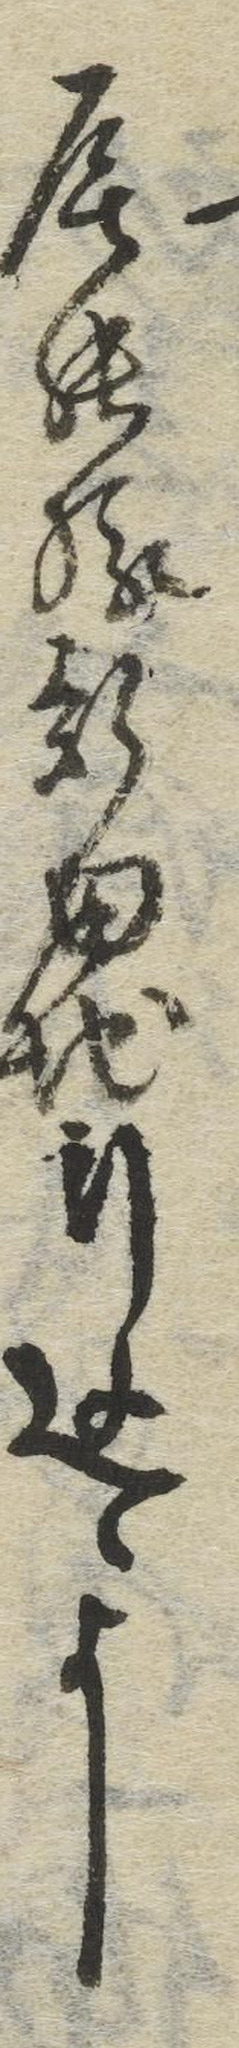尾張様新田地引込よし
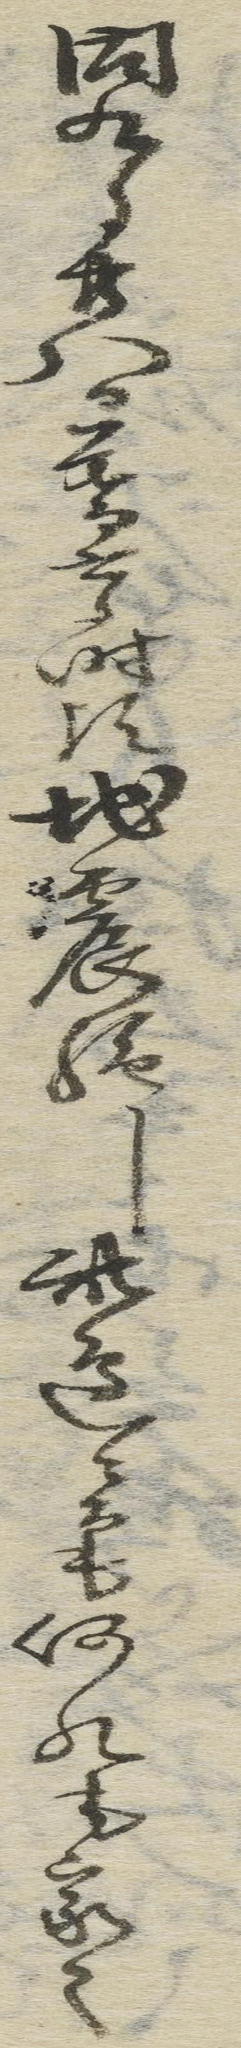同九月廿八日暮六ッ時地震強し此辺二而も何れも家々
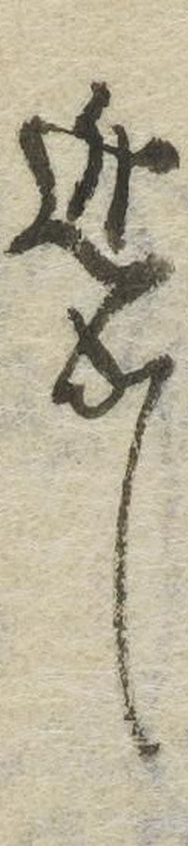逃出し
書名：信濃越後　地震書留
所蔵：東京大学地震研究所図書室 Earthquake Research Institute Library, The University of Tokyo, JAPAN
